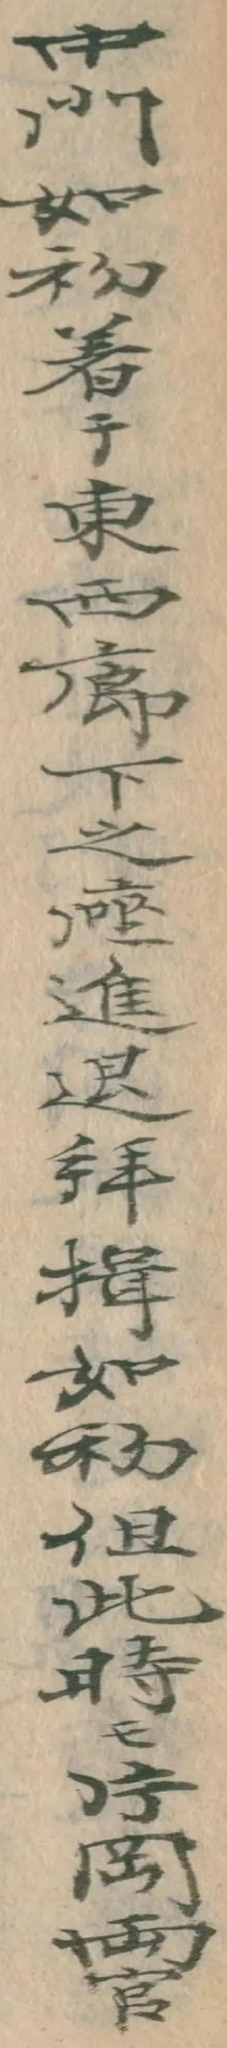中門如初着于東西廊下之座進退拝揖如初但此時モ片岡両官
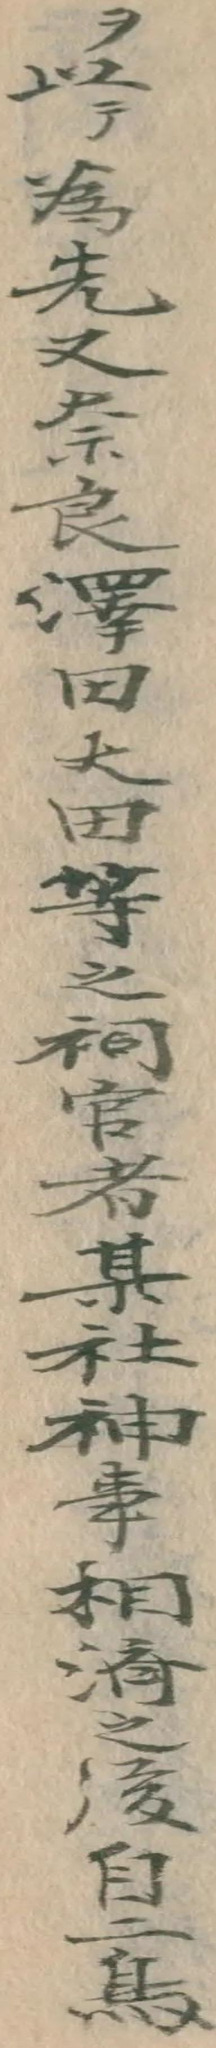ヲ以テ為先又奈良沢田大田等之祠官者某社神事相済之後自二鳥
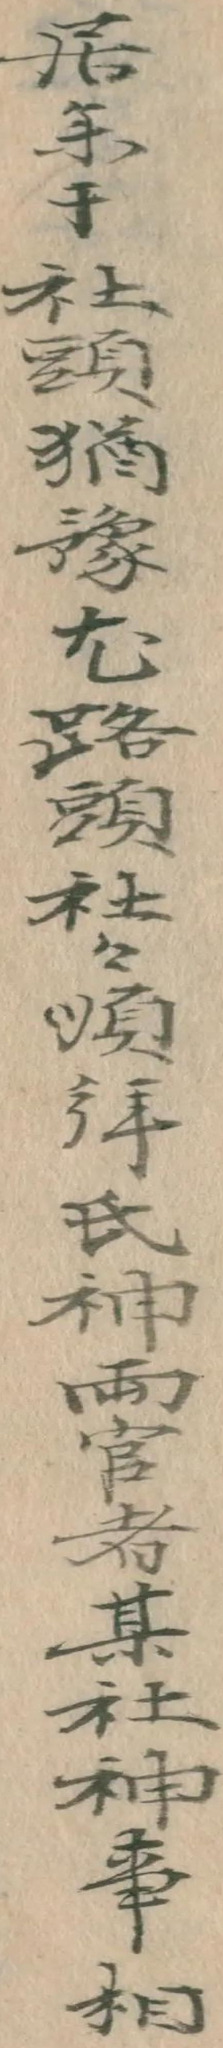居参于社頭猶予尤路頭社々順拝氏神両官者某社神事相
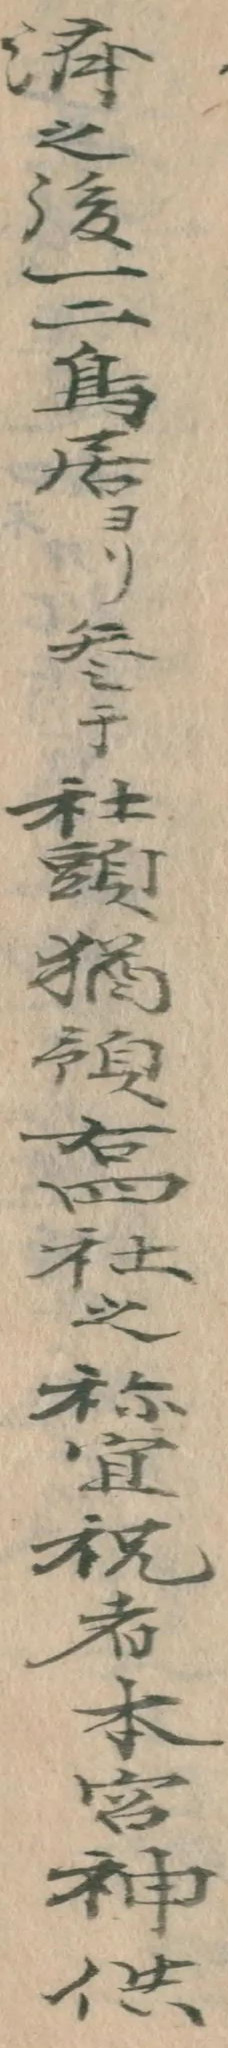済之後一二島居ヨリ参于社頭猶預右四社之祢宜祝者本宮神供
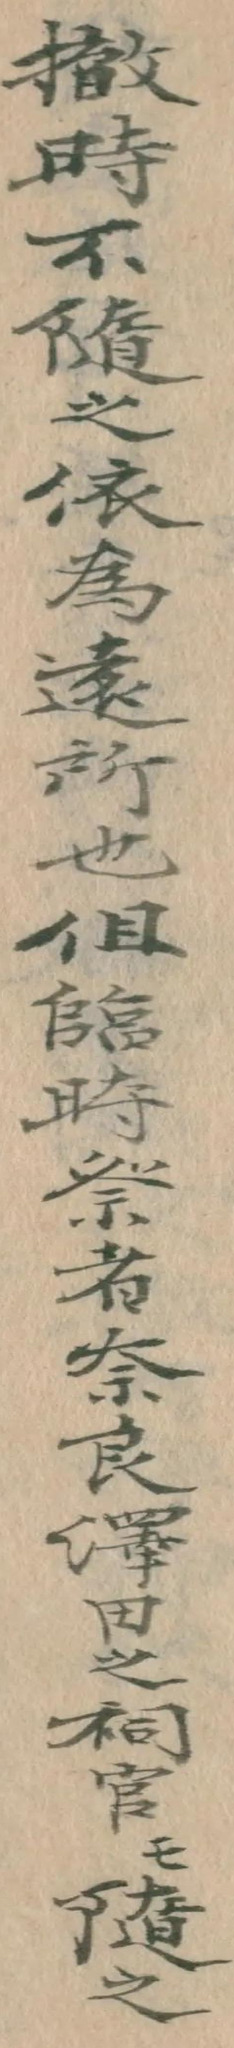撤時不隨之依為遠所也但臨時祭者奈良沢田之祠官モ随之
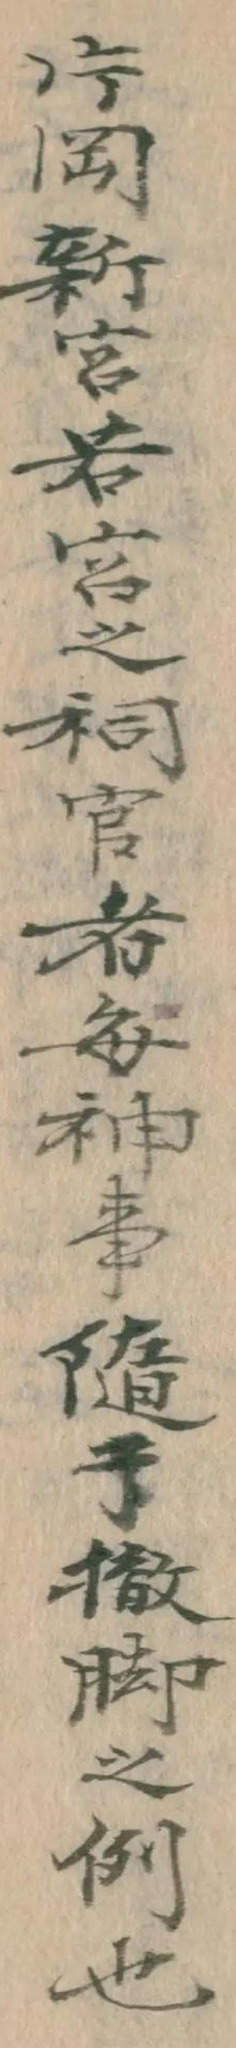片岡新宮若宮之祠官者毎神事随于撤脚之例也
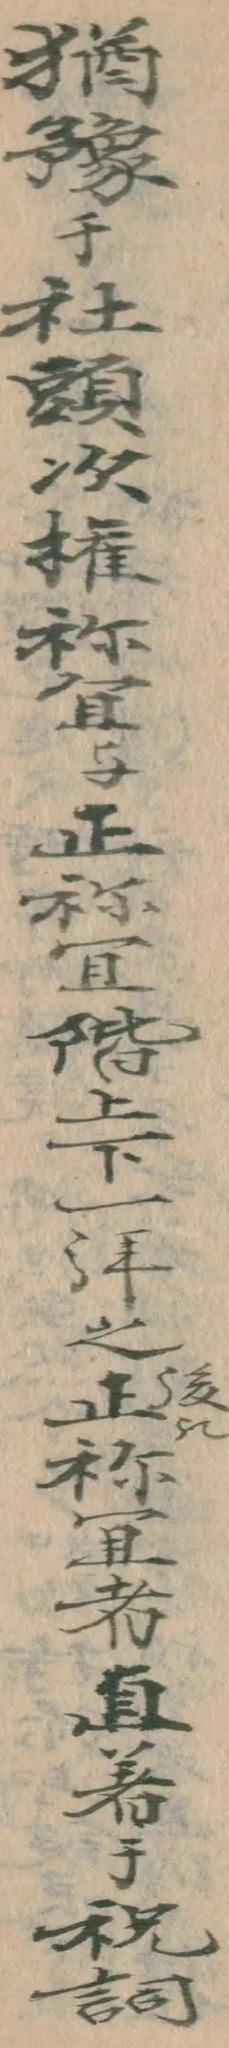猶予于社頭次権祢宜与正祢宜階上下一拝之正祢宜者直着于祝詞
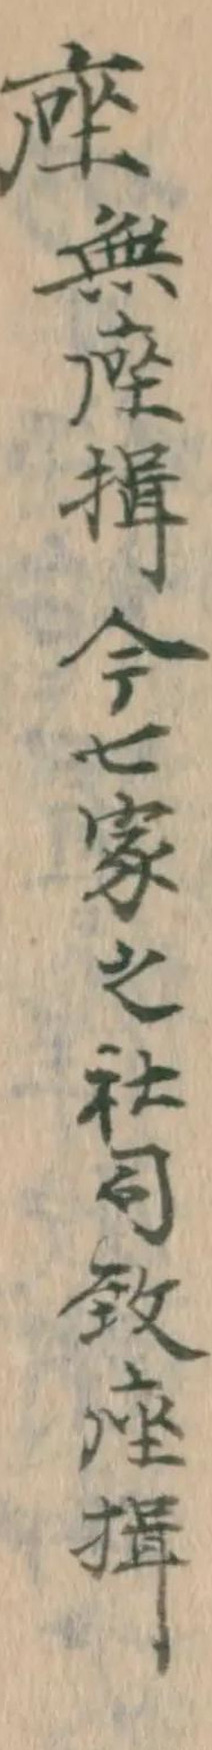座無座揖今七家之社司致座揖
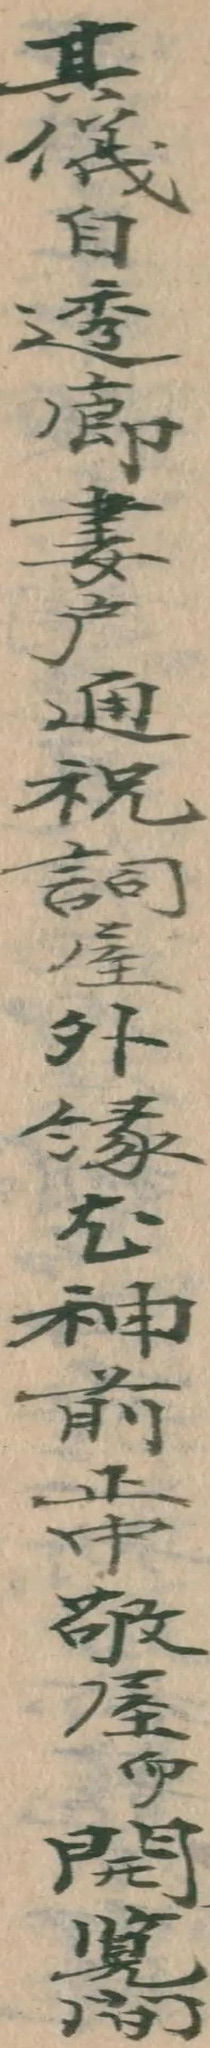其儀自透廊妻戸通祝詞屋外縁尤神前正中敬屋而開覧間
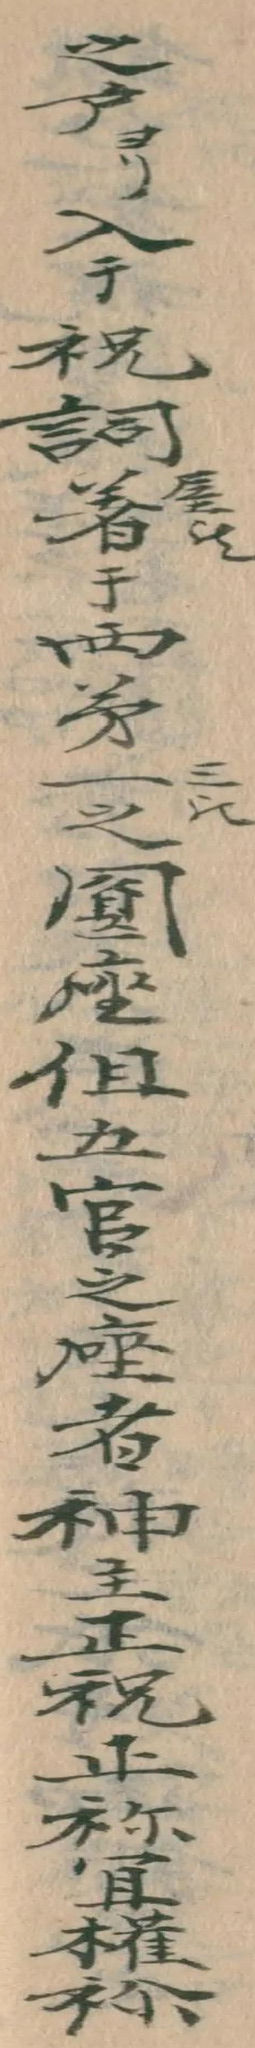之戸ヨリ入于祝詞着于西第一之円座但五宮之座者神主正祝正祢宜権祢
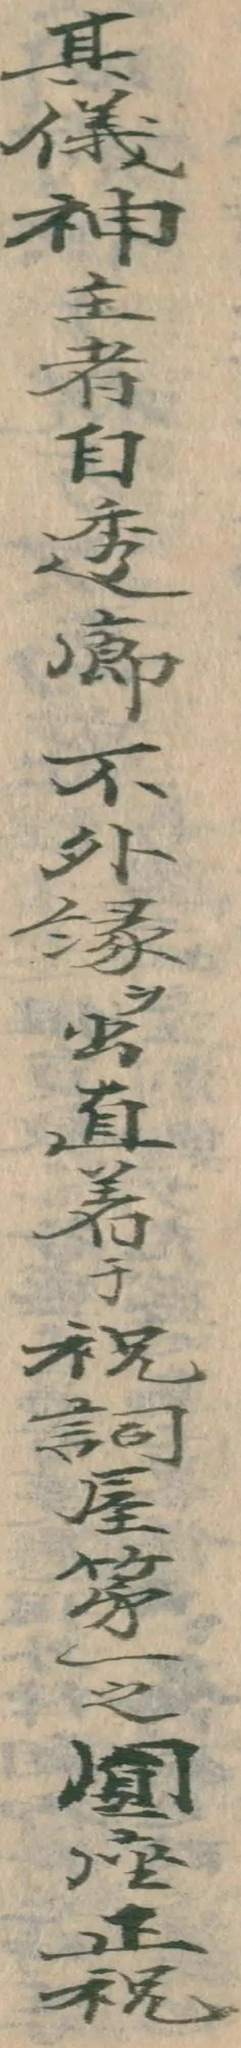其儀神主者自透廊不外縁ヲ出直着于祝詞屋第一之円座正祝
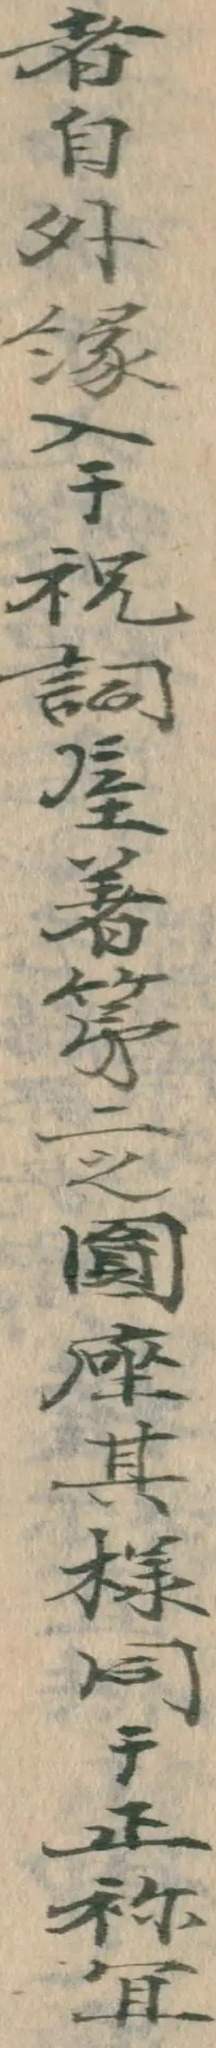者自外縁入于祝詞屋着第二之円座其様同于正祢宜
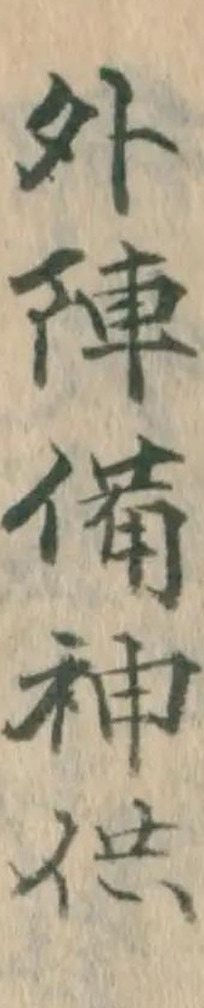外陣備神供
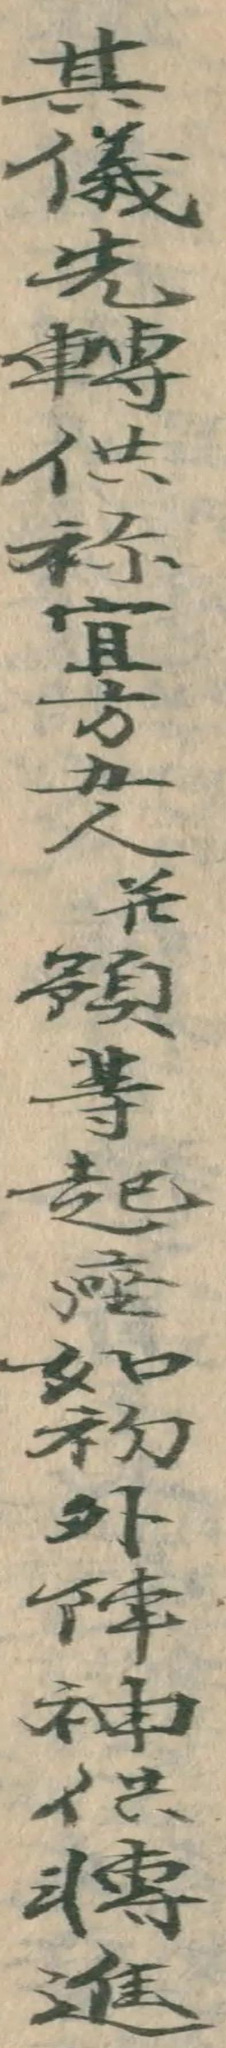其儀先転供祢宜方五人并預等起座如初外陣神供転進

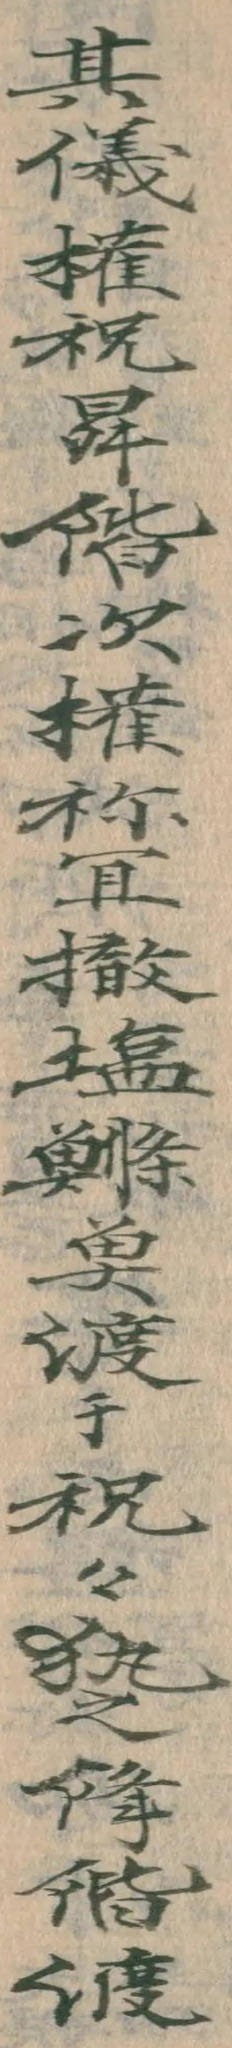其儀権祝昇階次権祢宜撤塩鰷魚渡于祝々執之降階渡
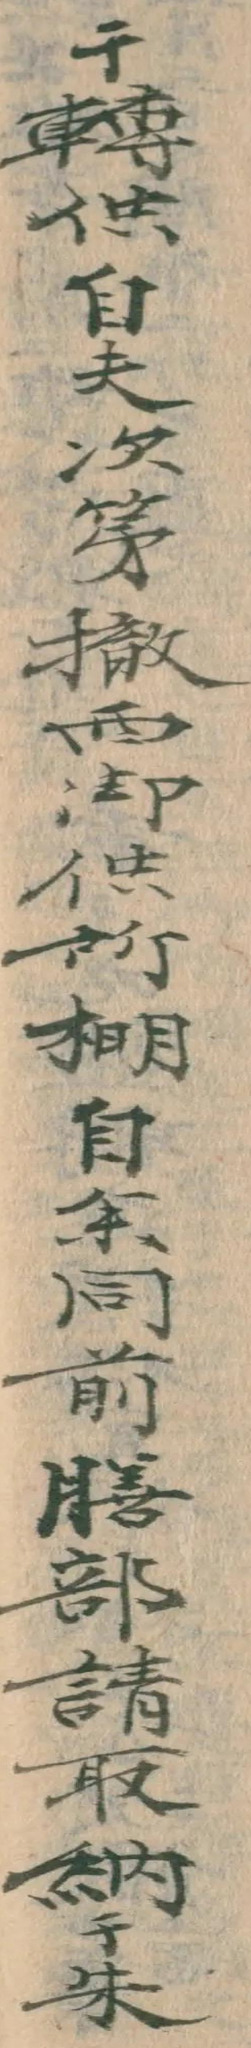于転供自夫次第撤西御供所棚自余同前膳部請取納于朱
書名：賀茂社記録. 第9冊
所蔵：国立国会図書館 National Diet Library, JAPAN
